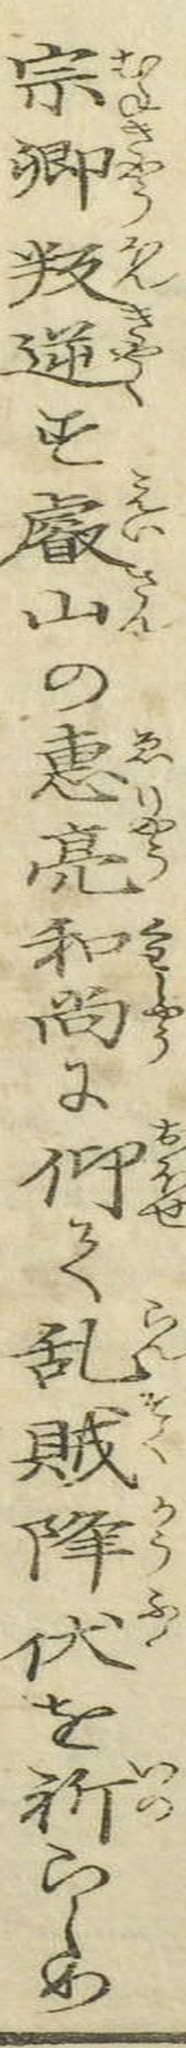宗卿叛逆す叡山の恵亮和尚に仰て乱賊降伏を祈らしめ
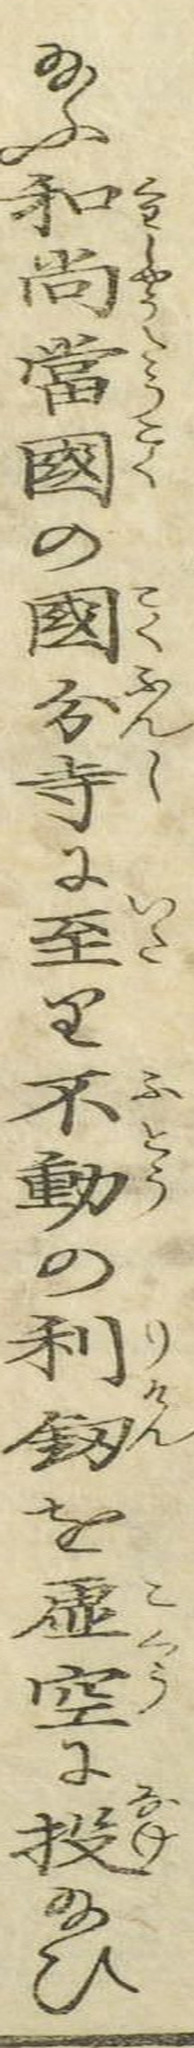給ふ和尚当国の国分寺に至り不動の利釼を虚空に投給ひ
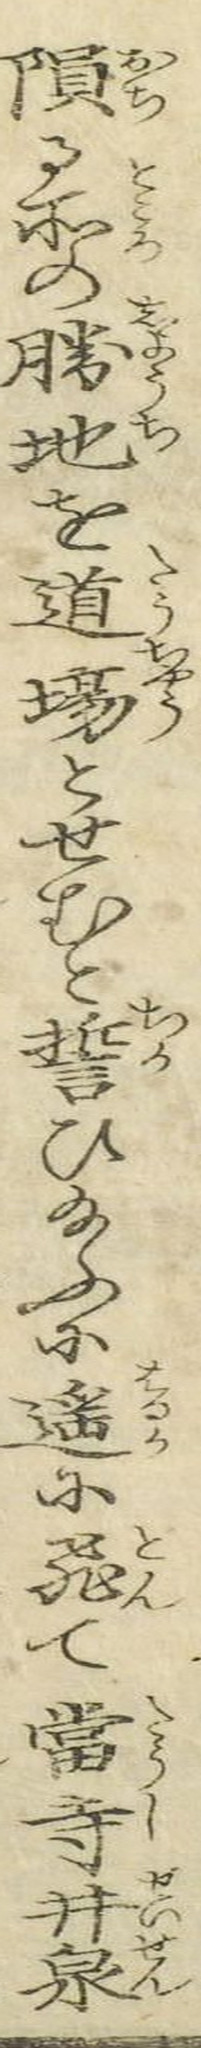隕る所の勝地を道場とせむと誓ひ給ふに遙に飛て当寺井泉
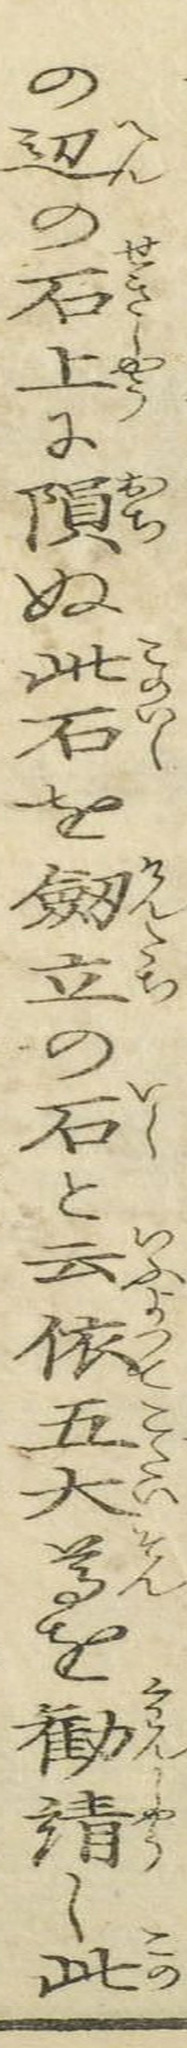の辺の石上に隕ぬ此石を劔立の石と云依五大尊を勧請し此
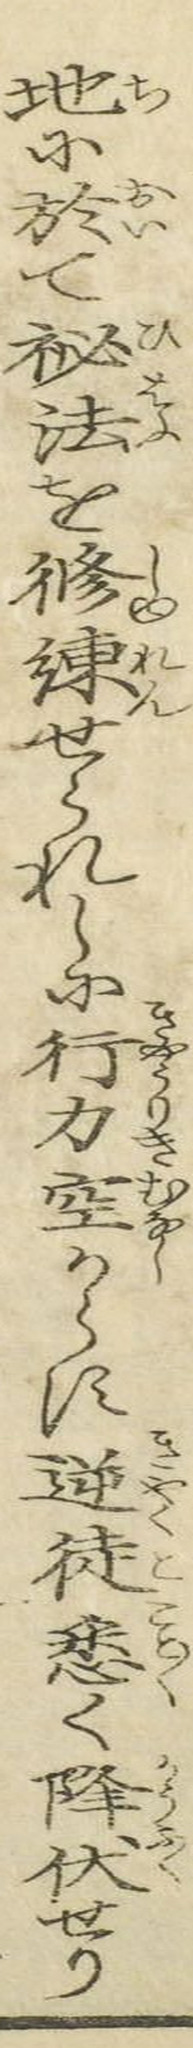地に於て秘法を修練せられしに行力空からす逆徒悉降伏せり
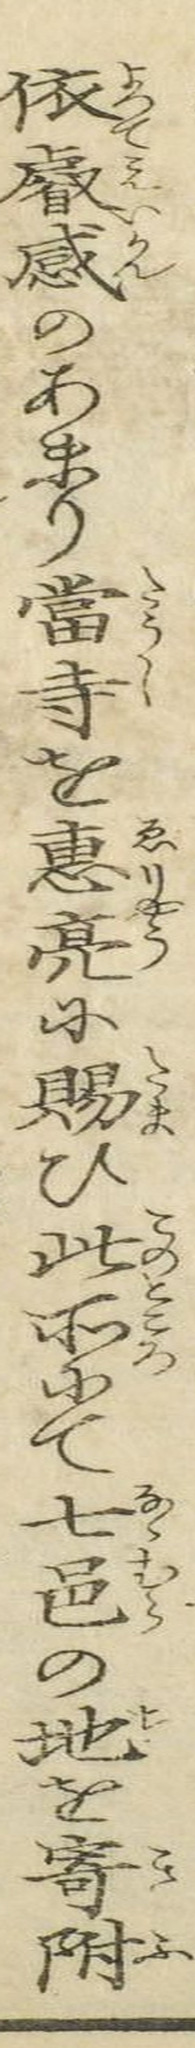依叡感のあまり当寺を恵亮に賜ひ此所にて七邑の地を寄付
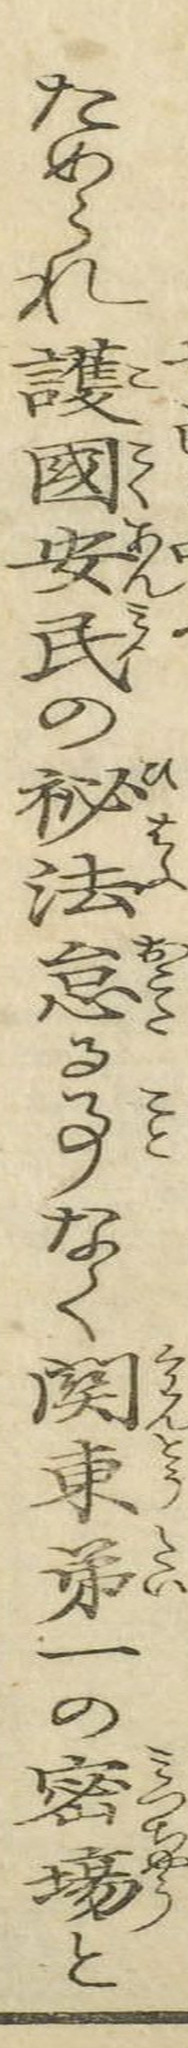ためられ護国安民の秘法怠る事なく関東第一の密場と
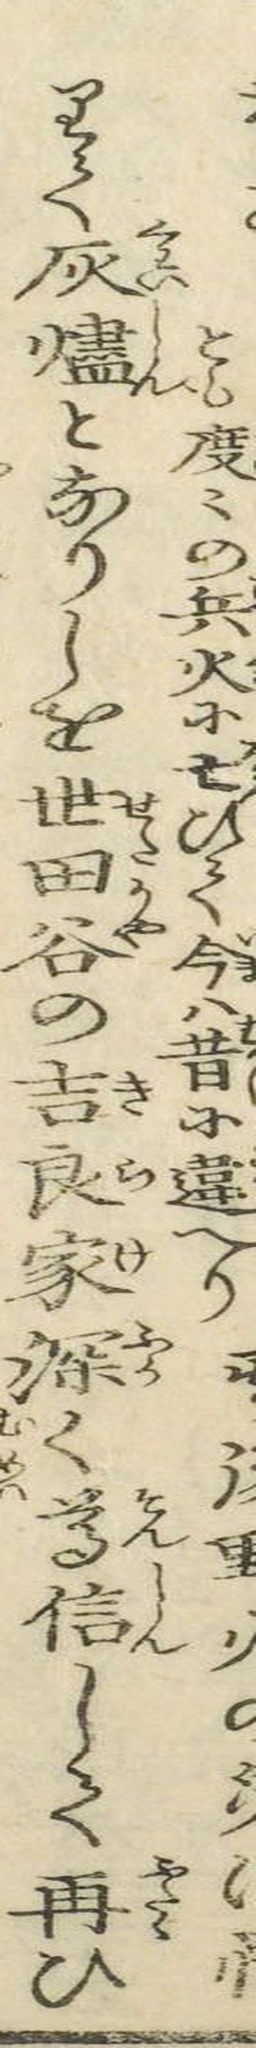りて灰燼となりしを世田谷の吉良家深く尊信して再ひ
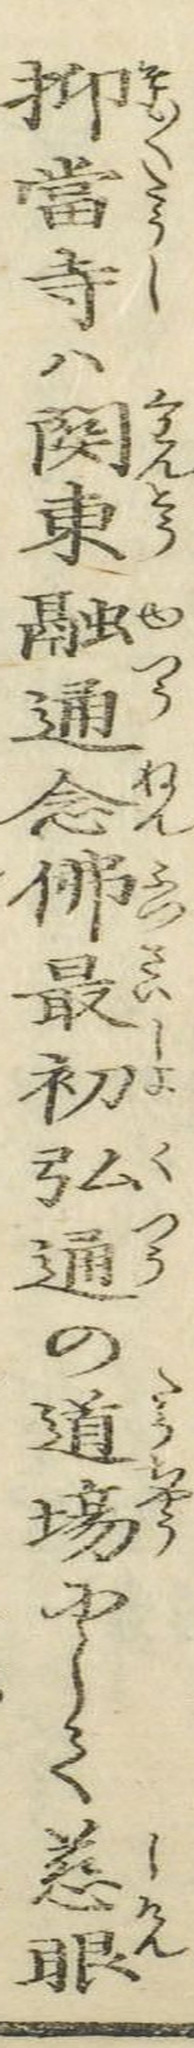抑当寺は関東融通念仏最初弘通の道場にして慈眼
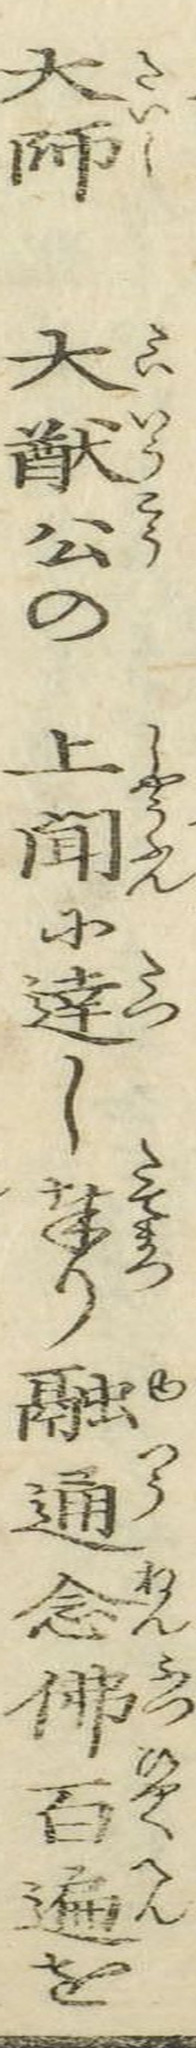大師大猷公の上聞に達し奉り融通念仏百遍を
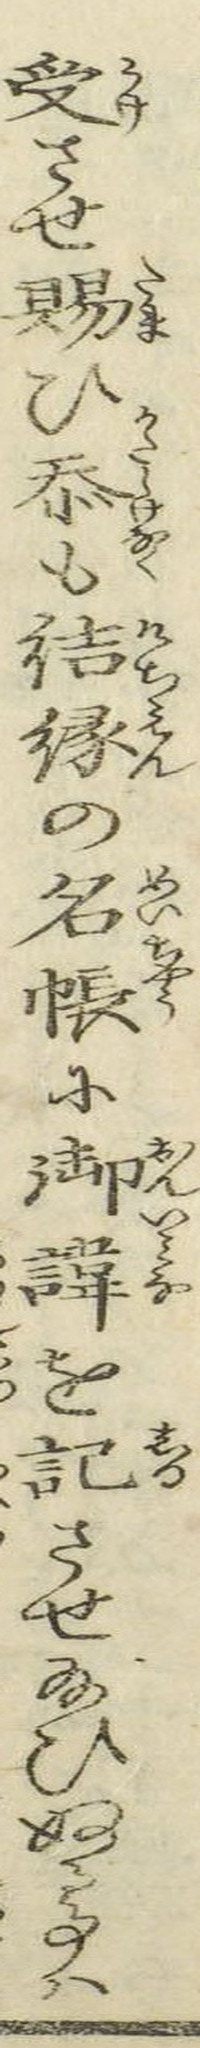受させ賜ひ忝も結縁の名帳に御諱を記させ給ひぬる事は
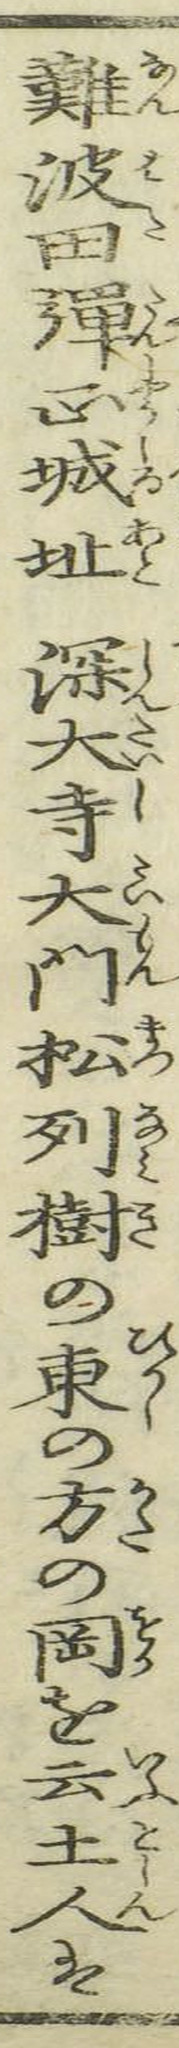難波田弾正城跡深大寺大門松列樹の東の方の岡を云土人は

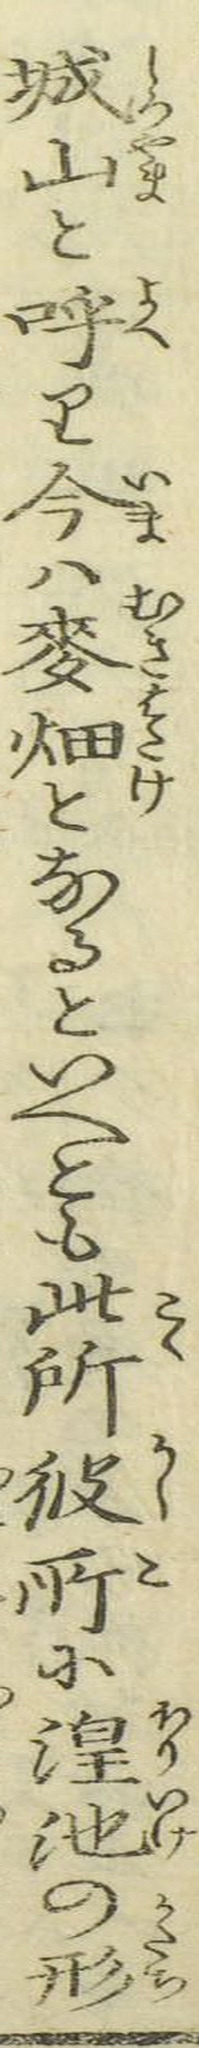城山と呼り今は麦畑となるといへとも此所彼所に湟池の形
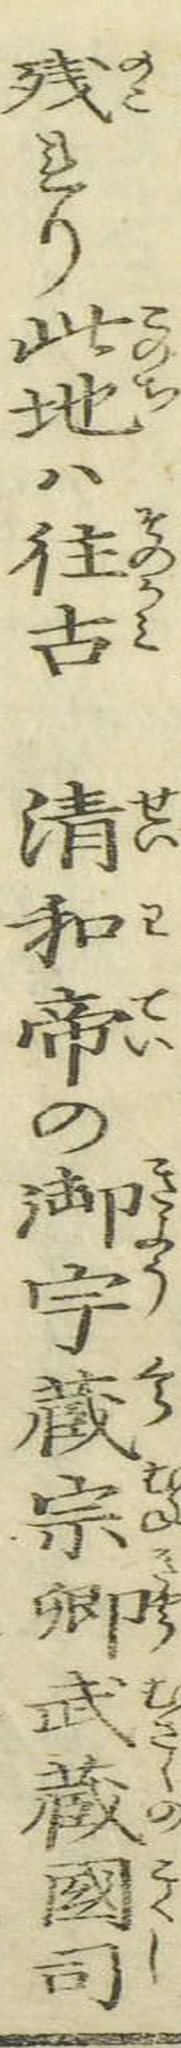残れり此地は往古清和帝の御宇蔵宗卿武蔵国司
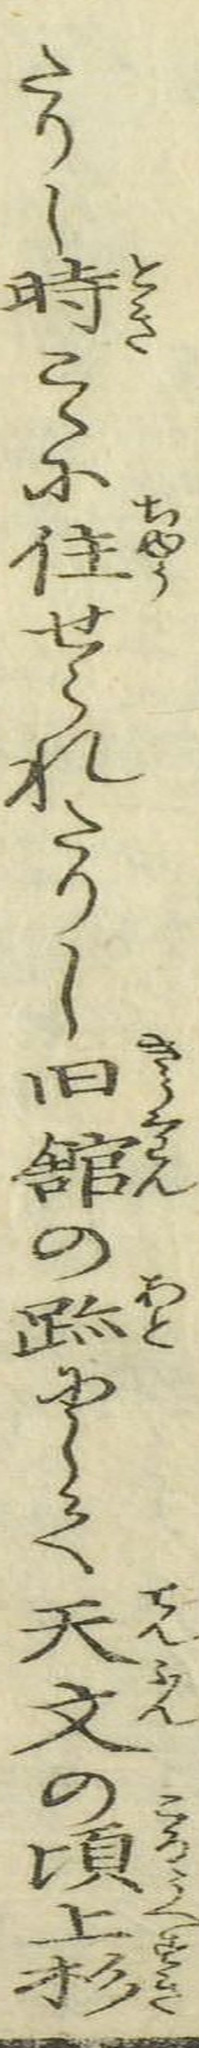たりし時こゝに住せられたりし旧館の跡にして天文の頃上杉
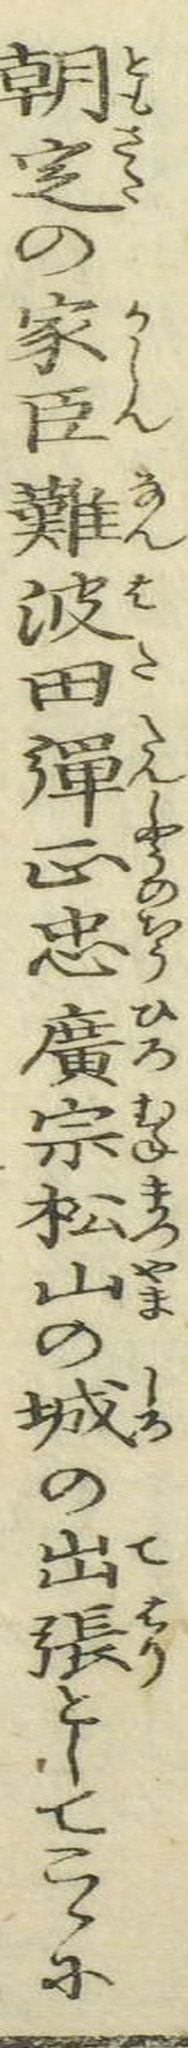朝定の家臣難波田弾正忠広宗松山の城の出張としてこゝに
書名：江戸名所図会 20巻 巻之9
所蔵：東京学芸大学教育コンテンツアーカイブ
